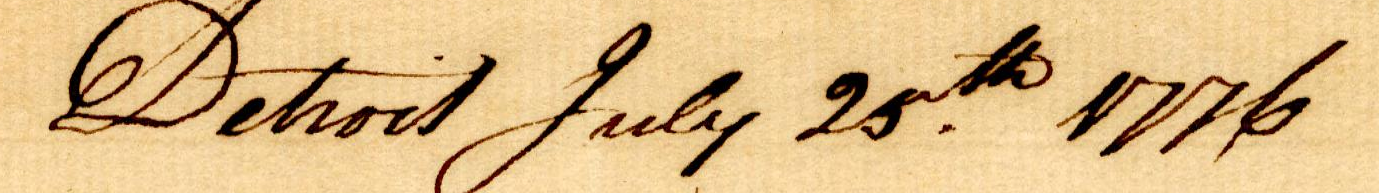Detroit July 25^th. 1776
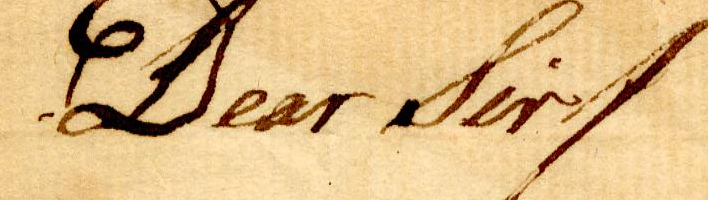Dear Sirs
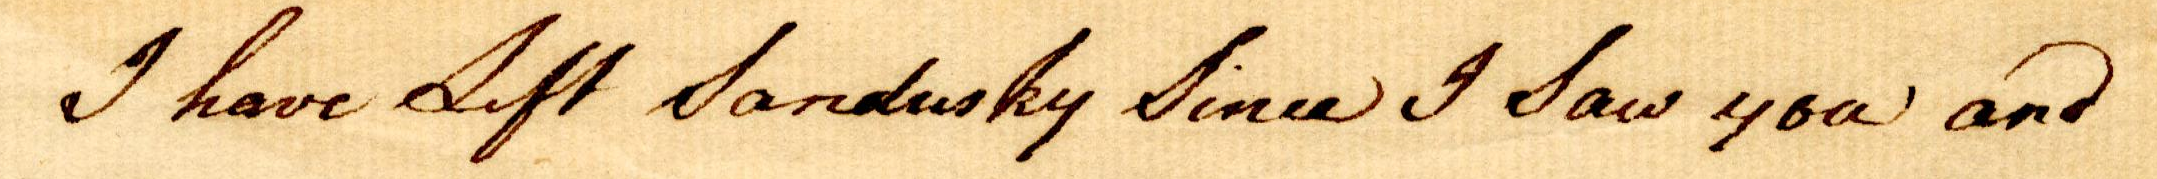I have Left Sandusky Since I Saw you and
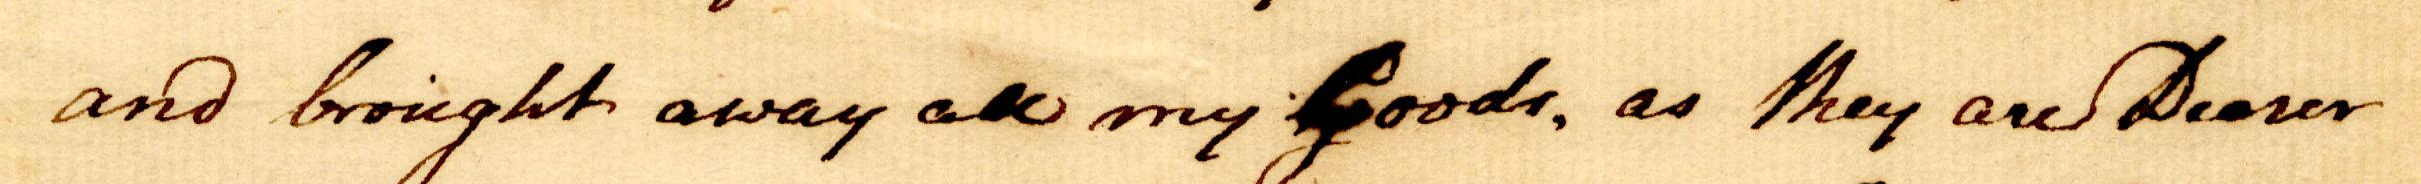and brought away all my Goods, as they are Dearer
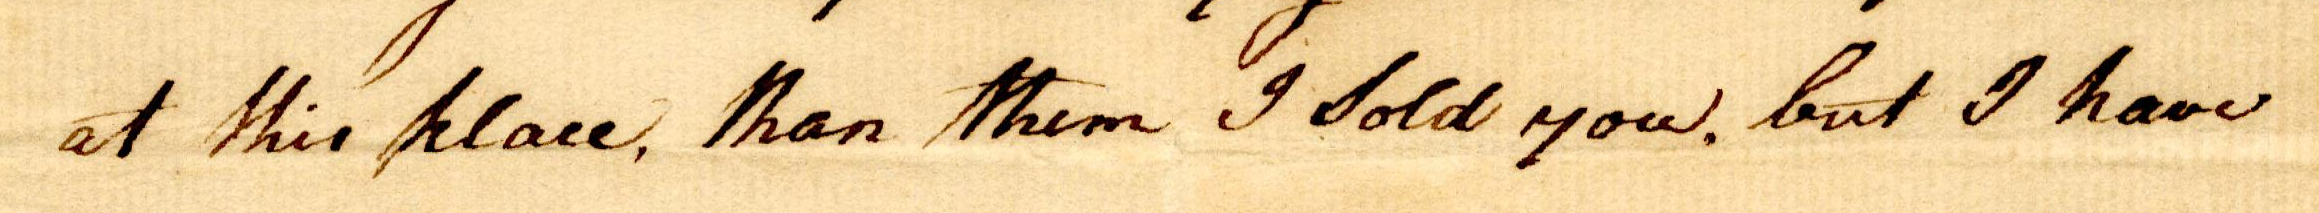at this place, than them I Sold you, but I have
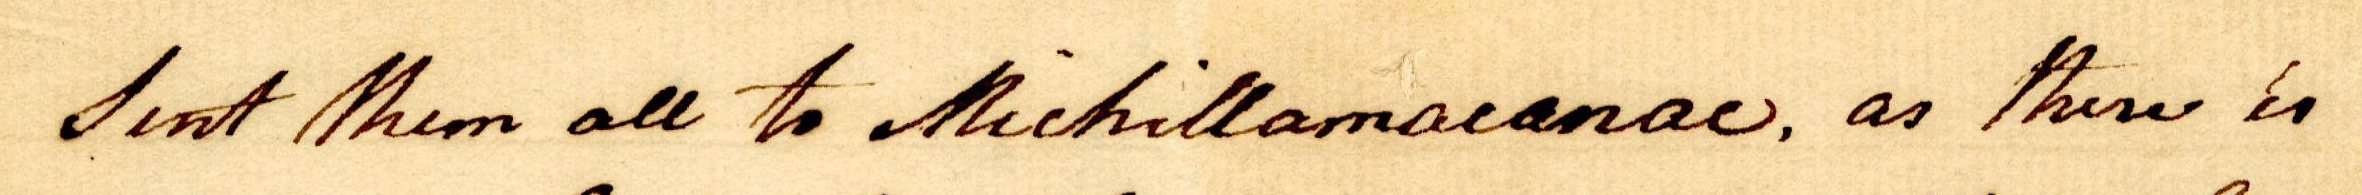Sent them all to Michillamacanac, as there is
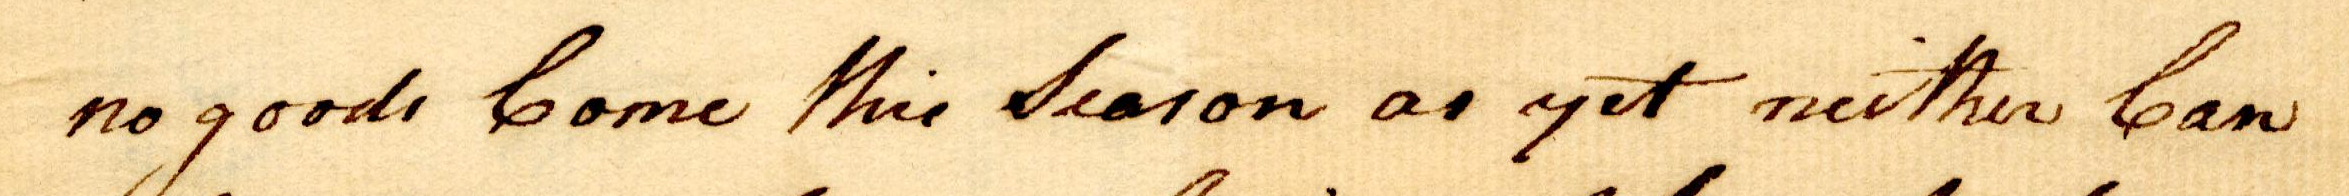no goods Come this Season as yet neither Can
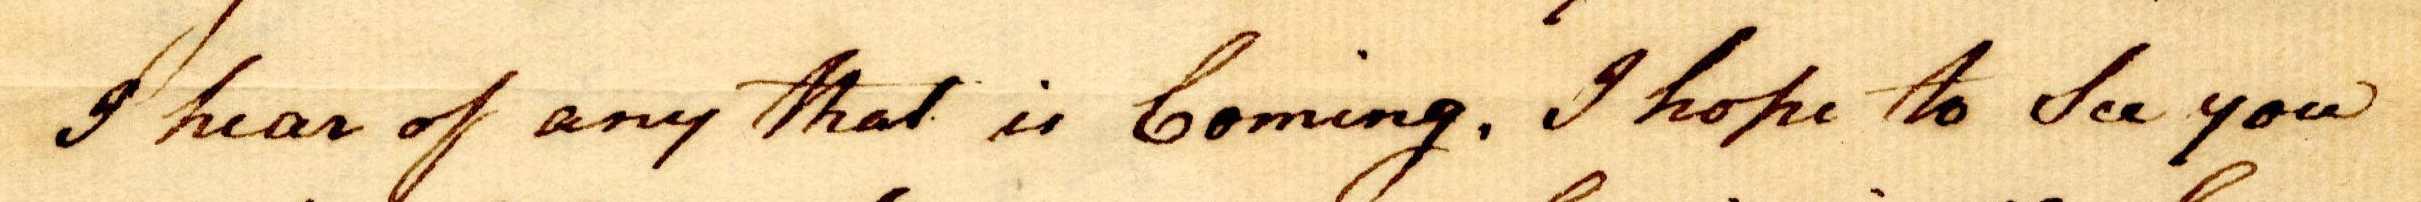I hear of any that is Coming, I hope to See you
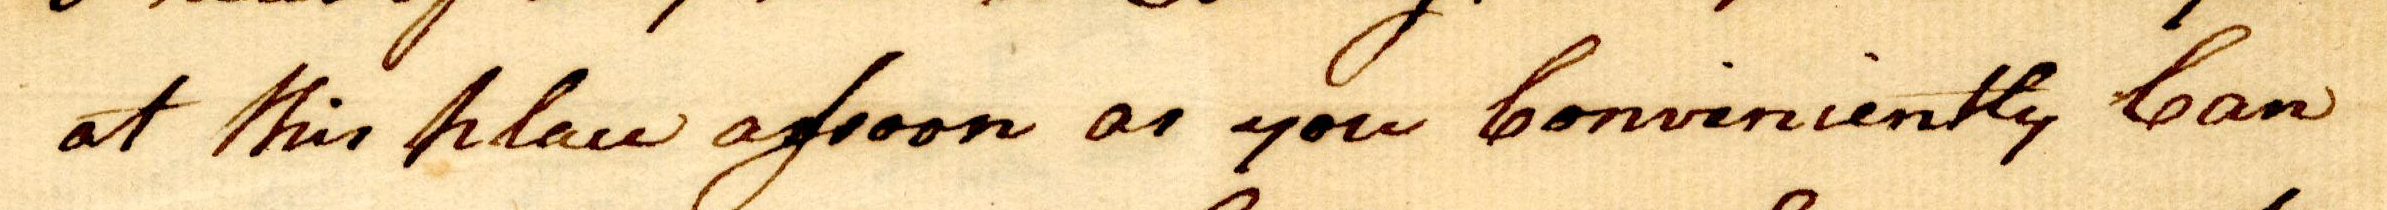at this place as soon as you Conveniently Can
